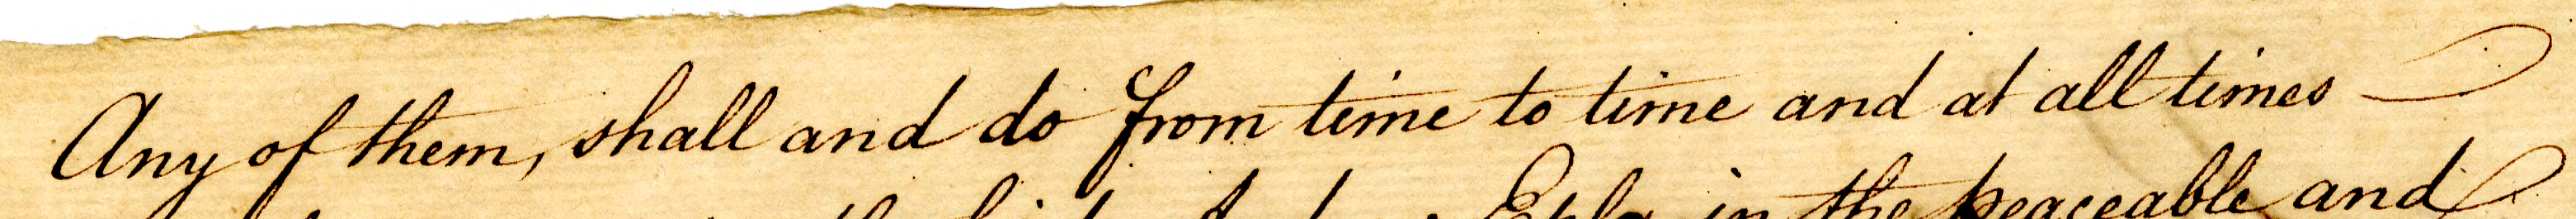Any of them, shall and do from time to time and at all times
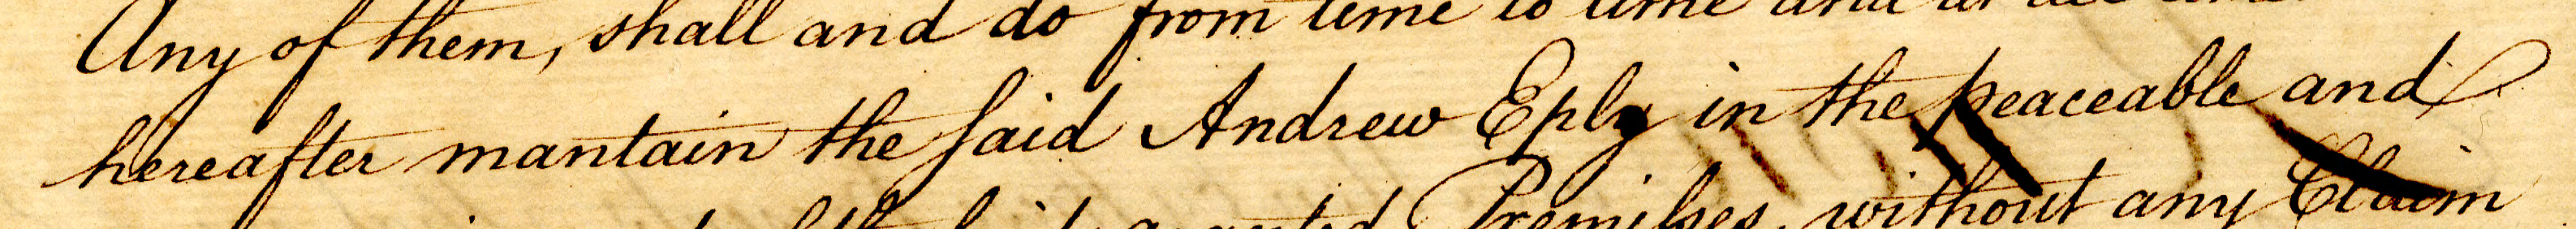hereafter maintain the said Andrew Eply in the peaceable and
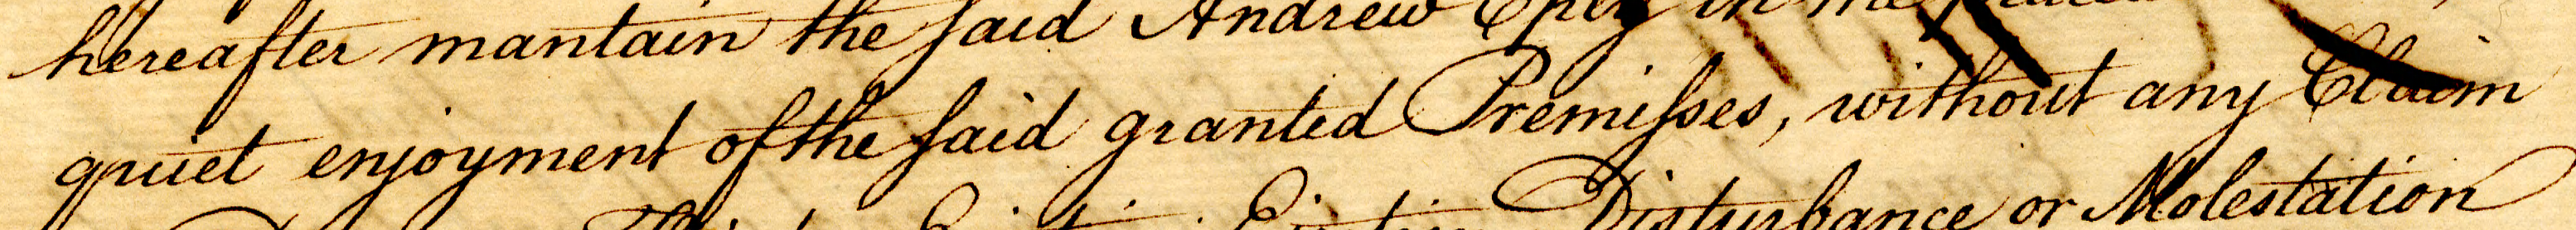quiet enjoyment of the said granted Premisses, without any Claim
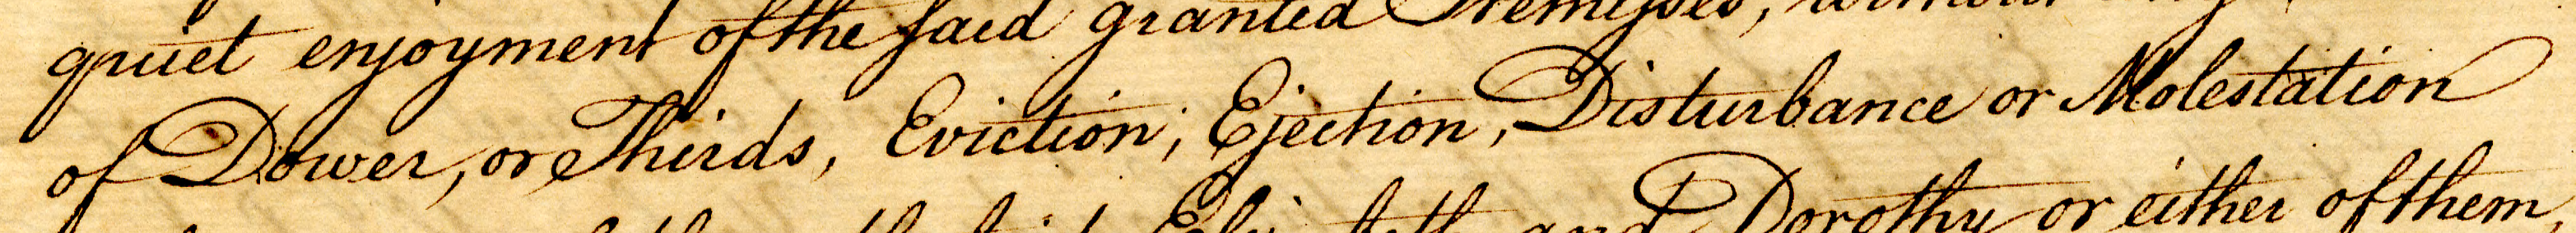of Dower, or Thirds, Eviction, Ejection, Disturbance or Molestation
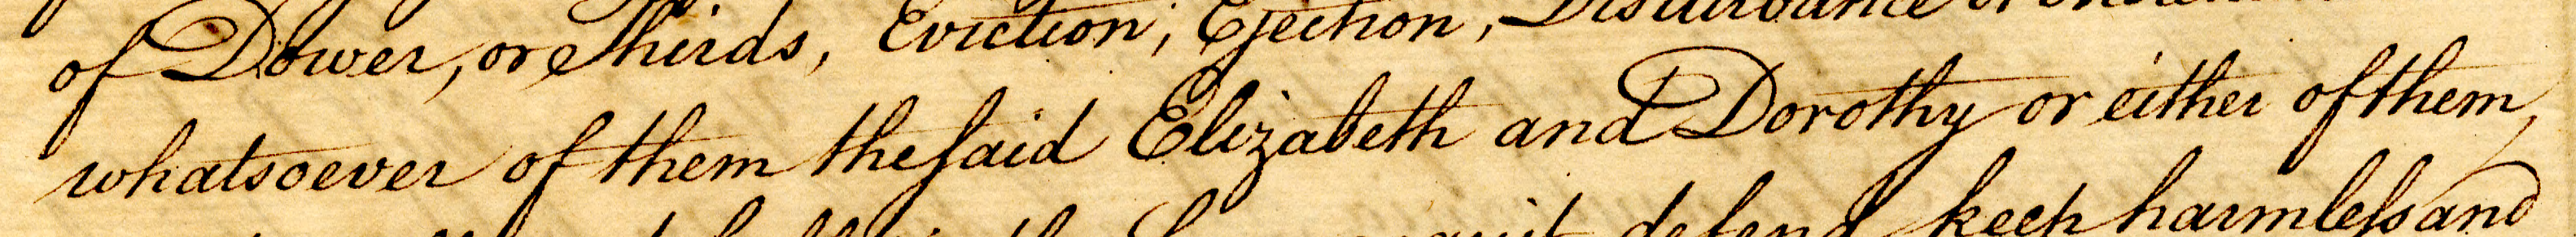whatsoever of them the said Elizabeth and Dorothy or either of them
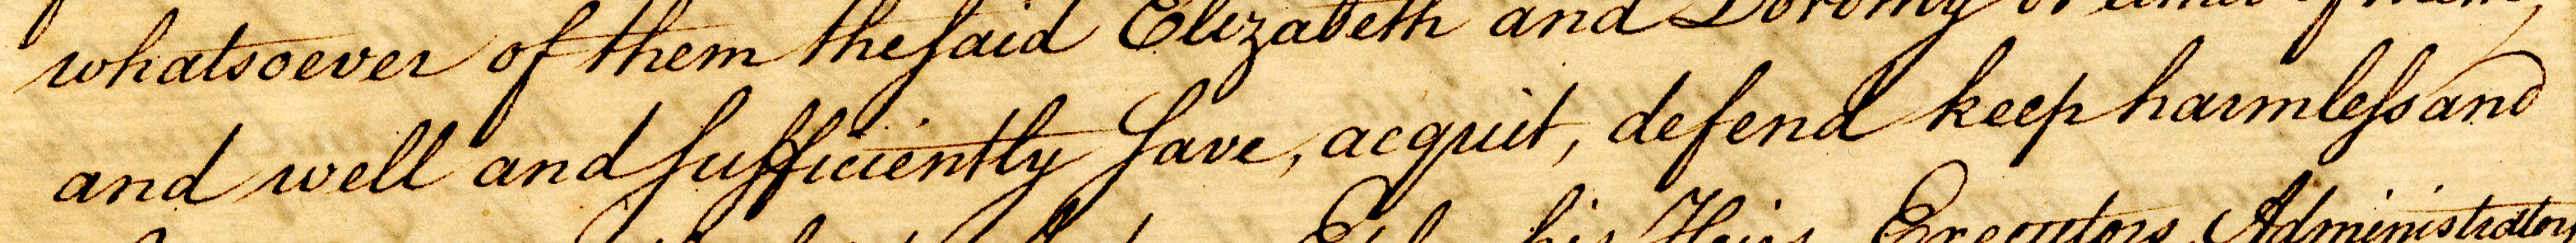and well and sufficiently save, acquit, defend keep harmless and
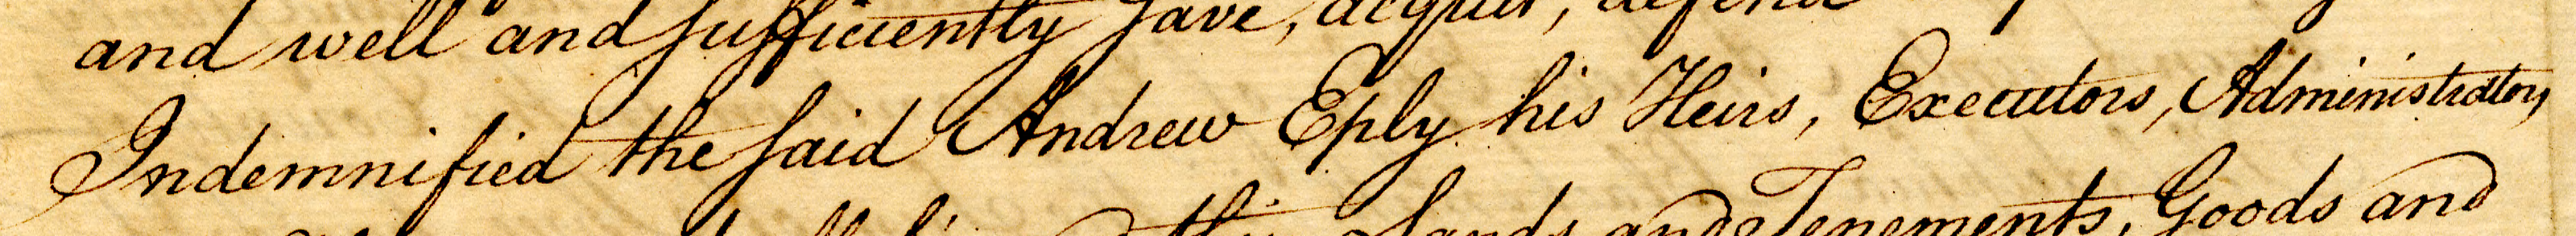Indemnified the said Andrew Eply his Heirs, Executors, Administrators
